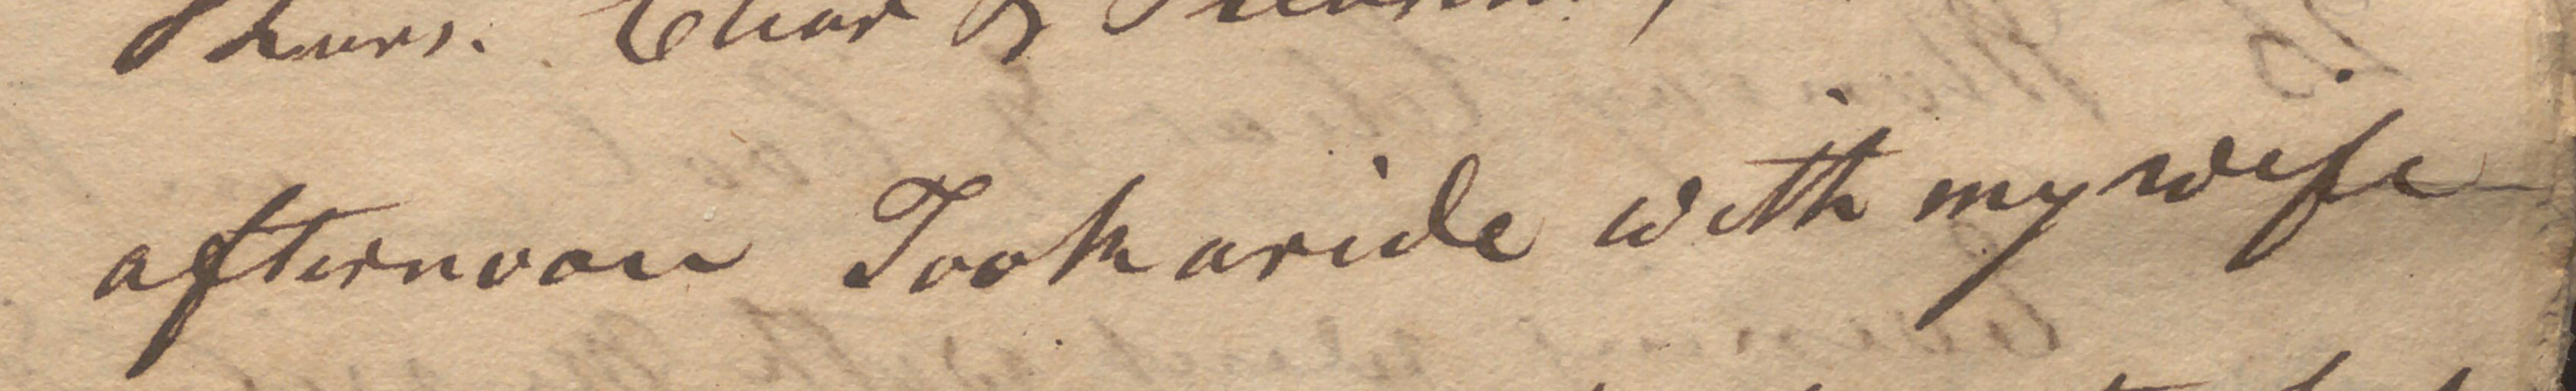afternoon Took a ride with my wife
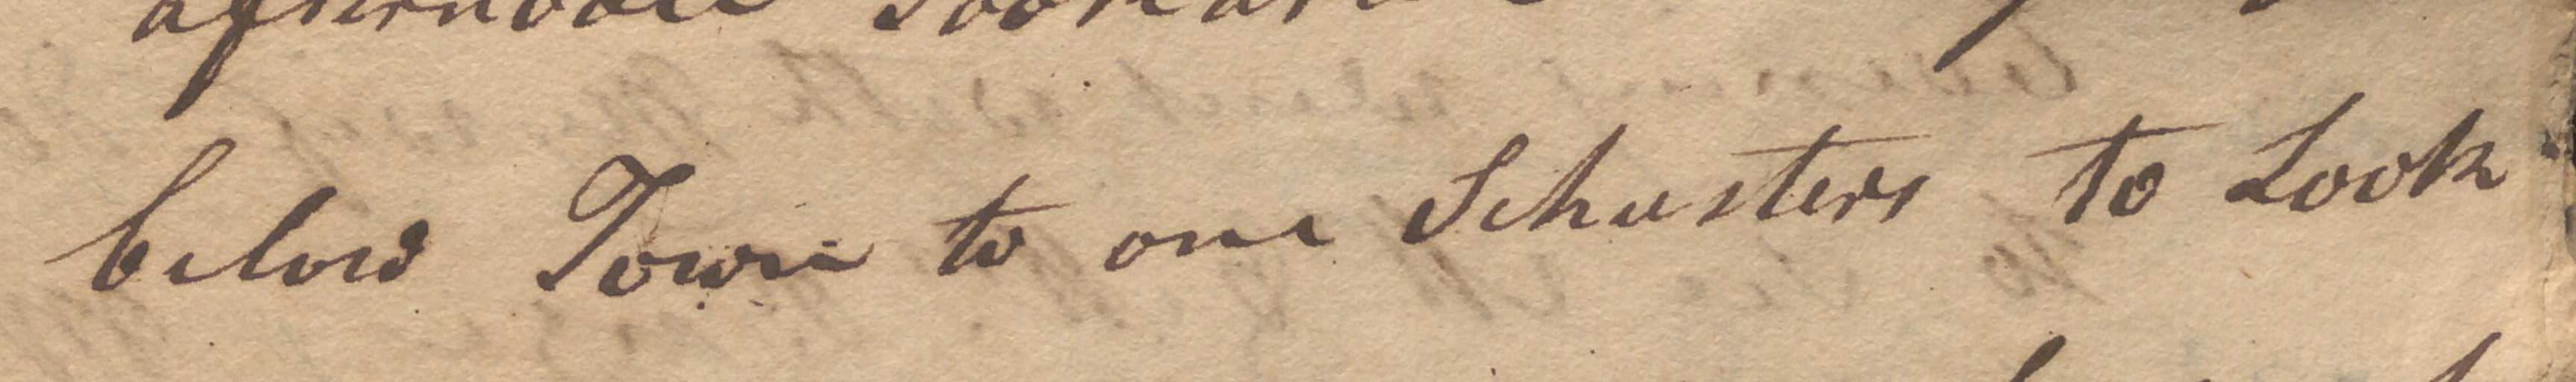below Town to our Schusters to Look
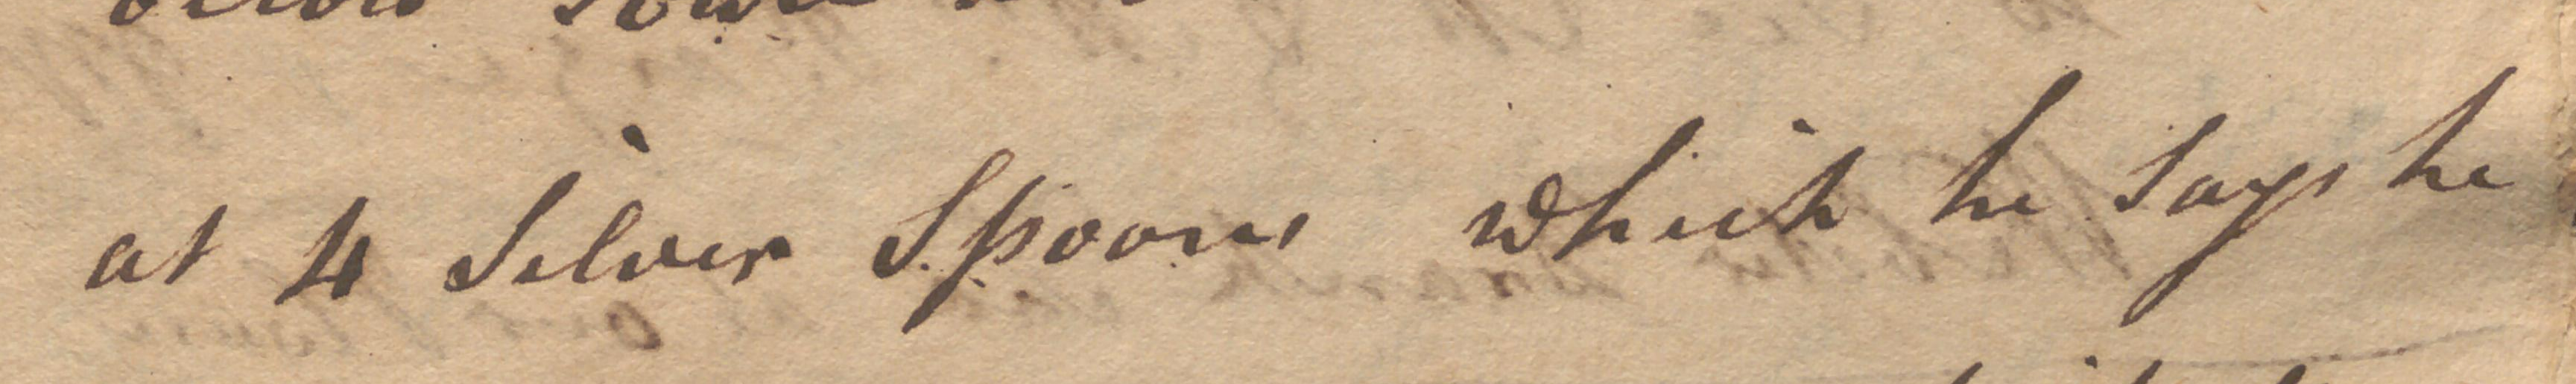at 4 silver Spoons which he says he
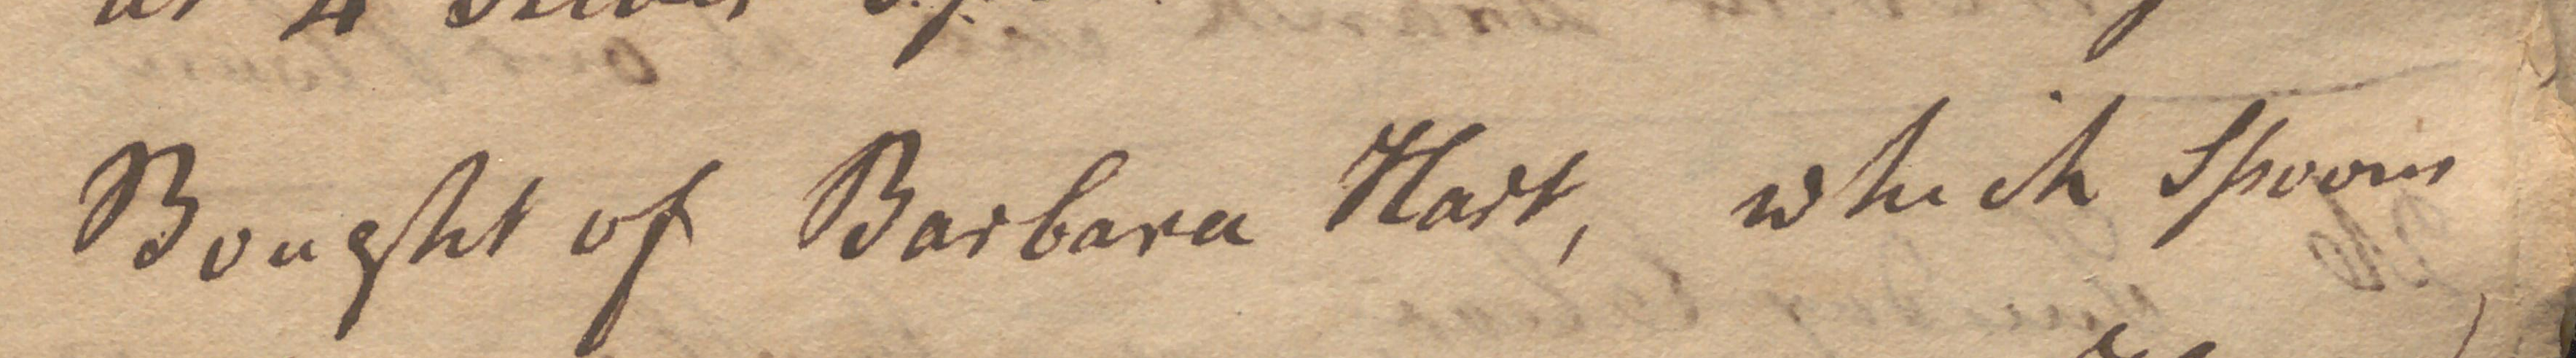Bought of Barbara Hart, which spoons
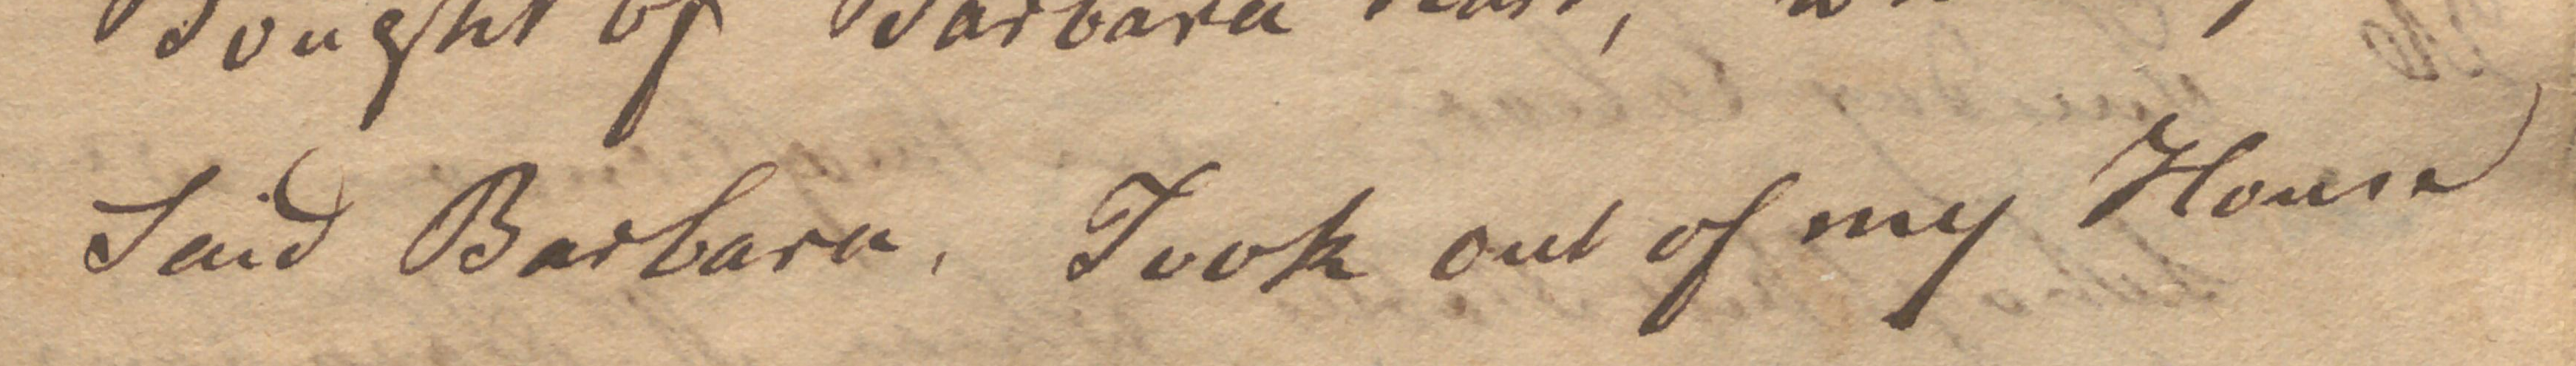Said Barbara. Took out of my House
